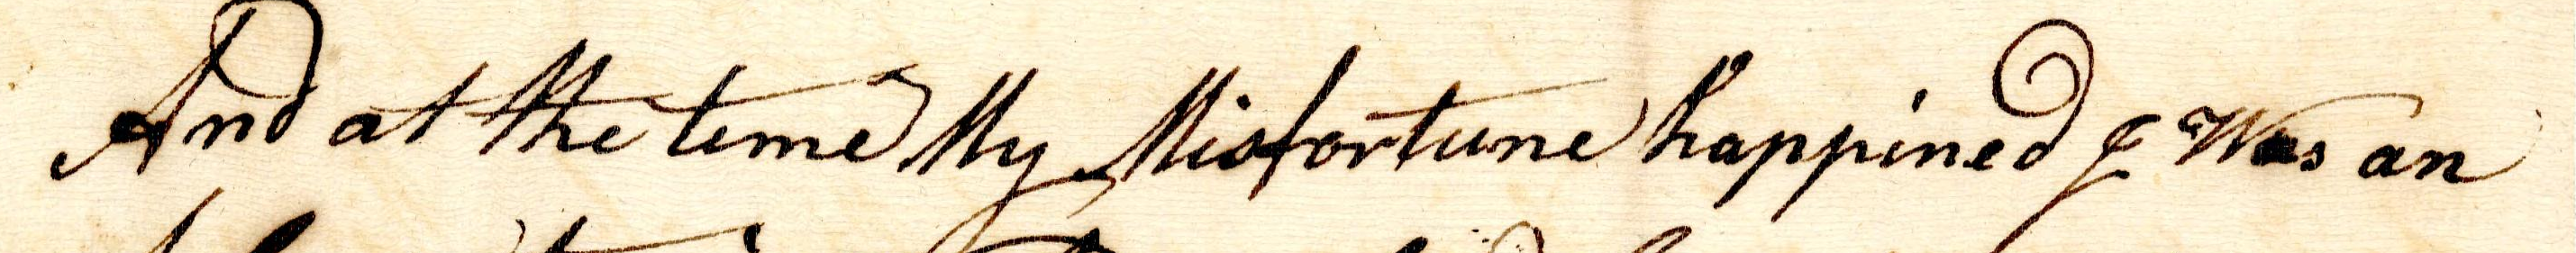And at the time My Misfortune happined I Was an
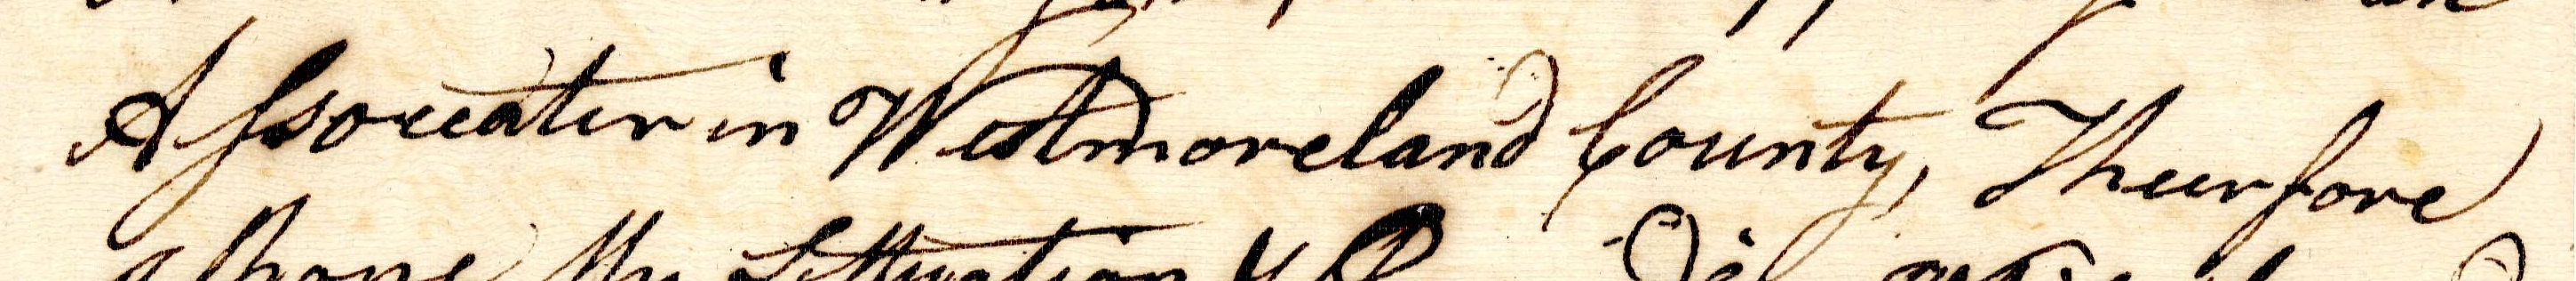Associatin in Westmoreland County, Therefore
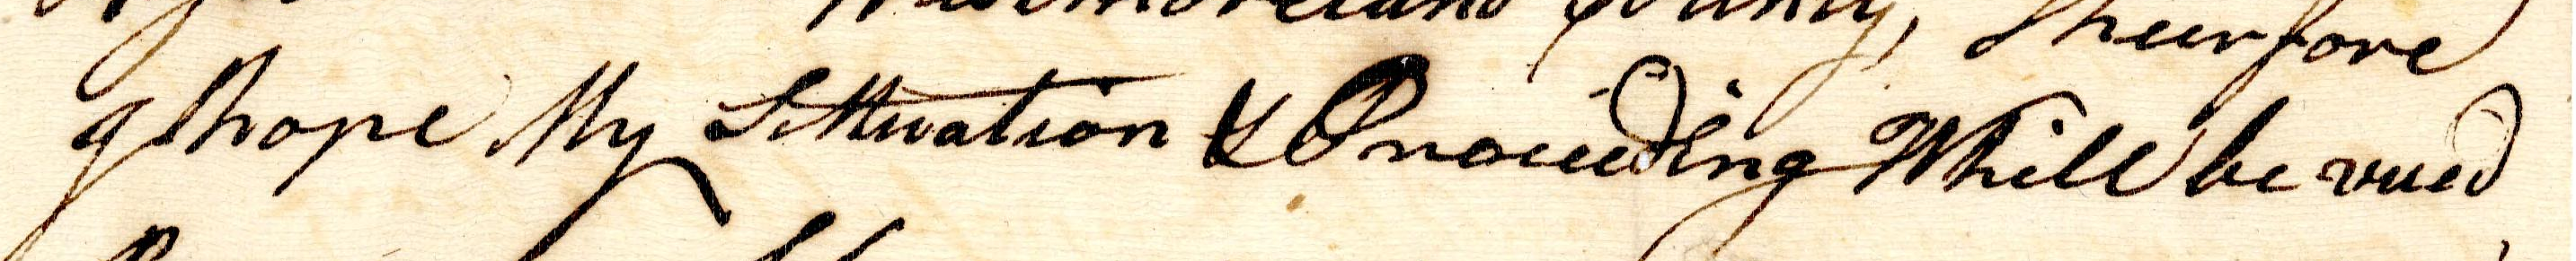I hope My Sittuation & Proceeding Whill be vued
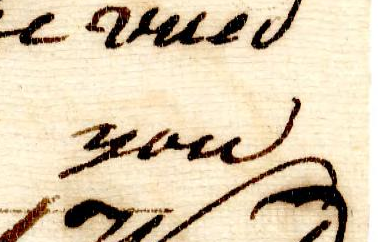you
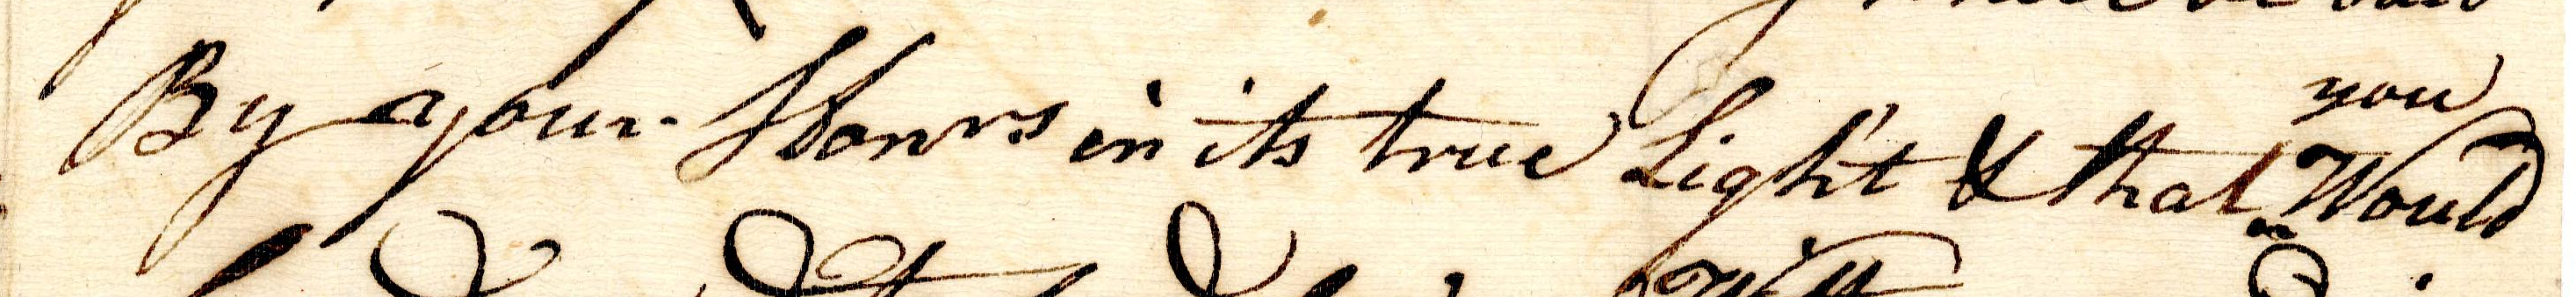By your Hon^rs in its true Light & that ^ Would
